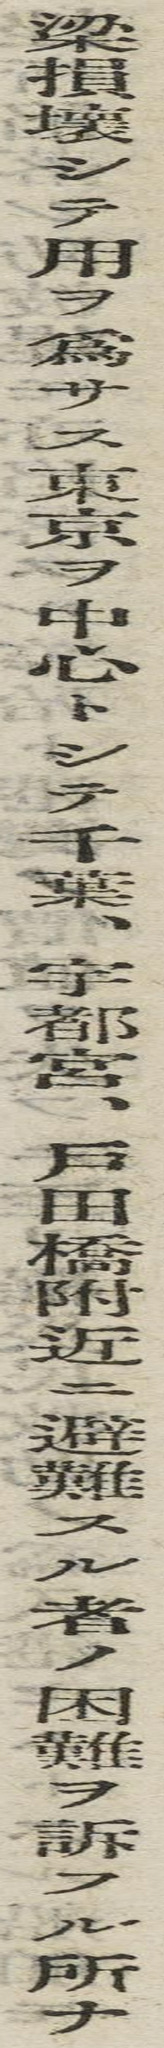梁損壊シテ用ヲ為サス東京ヲ中心トシテ千葉、宇都宮、戸田橋附近ニ避難スル者ノ困難ヲ訴フル所ナ
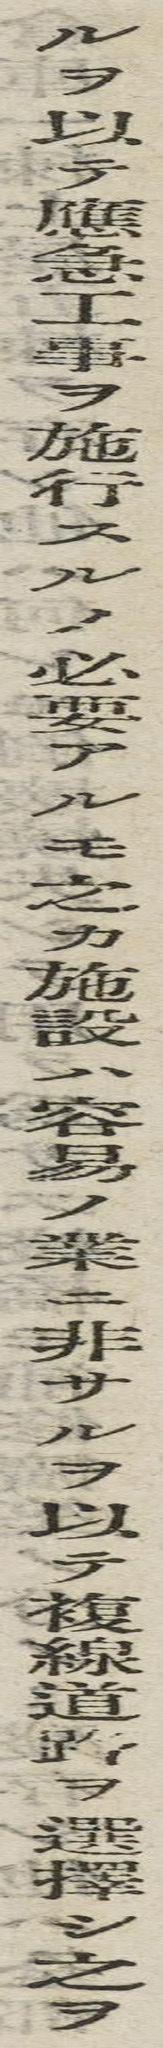ルヲ以テ応急工事ヲ施行スルノ必要アルモ之カ施設ハ容易ノ業ニ非サルヲ以テ複線道路ヲ選択シ之ヲ
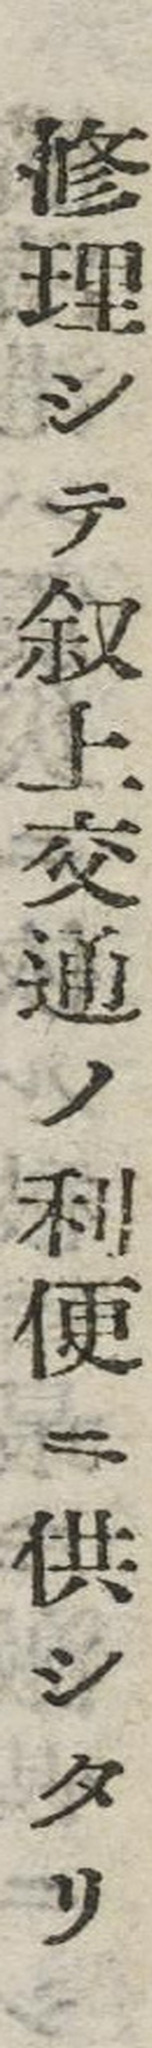修理シテ叙上交通ノ利便ニ供シタリ
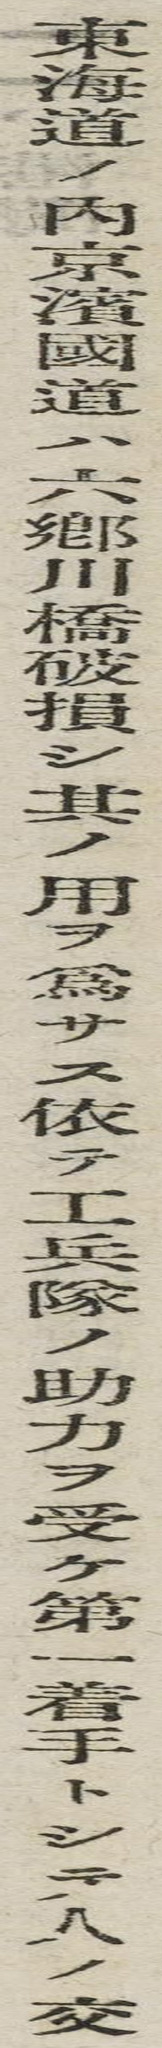東海道ノ内京浜国道ハ六郷川橋破損シ其ノ用ヲ為サス依テ工兵隊ノ助力ヲ受ケ第一着手トシテ人ノ交
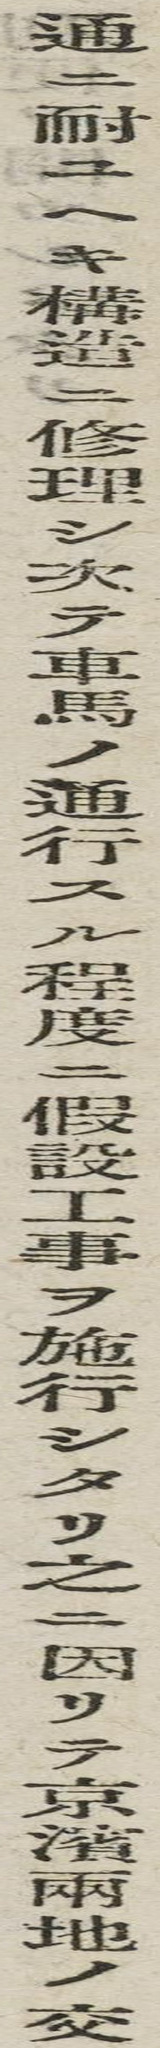通ニ耐ユヘキ構造ニ修理シ次テ車馬ノ通行スル程度ニ仮設工事ヲ施行シタリ之ニ因リテ京浜両地ノ交
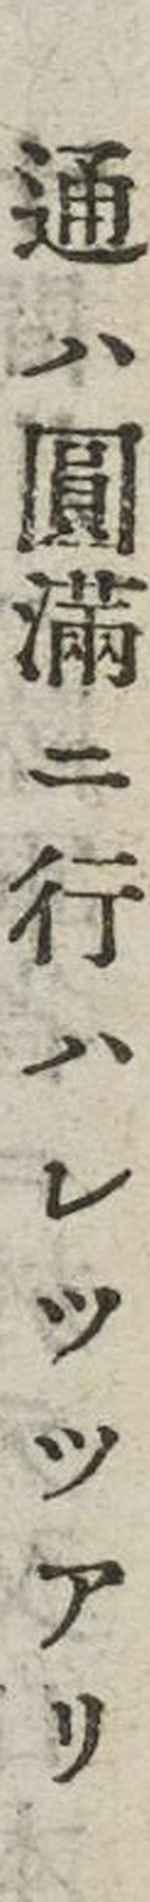通ハ円満ニ行ハレツツアリ
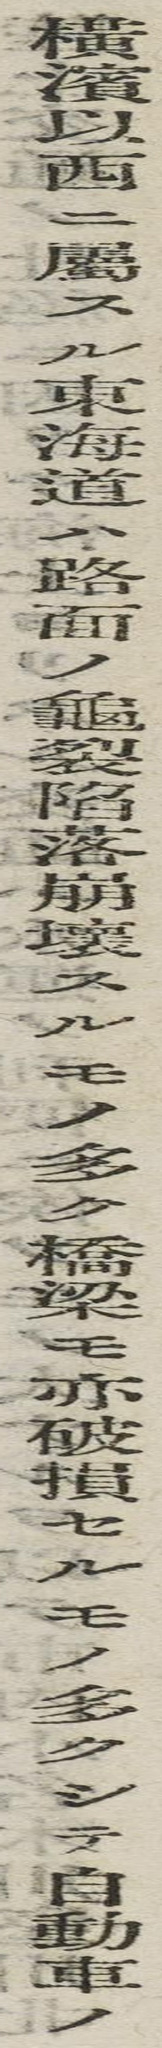横浜以西ニ属スル東海道ハ路面ノ亀裂陥落崩壊スルモノ多ク橋梁モ亦破損セルモノ多クシテ自動車ノ
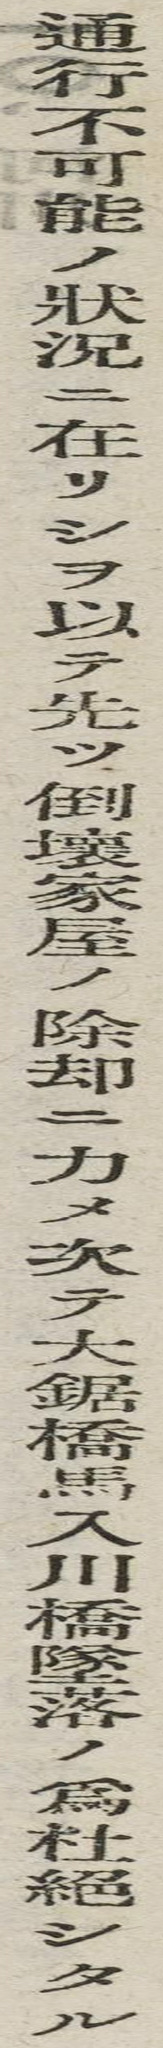通行不可能ノ状況ニ在リシヲ以テ先ツ倒壊家屋ノ除却ニ力メ次テ大鋸橋馬入川橋墜落ノ為杜絶シタル
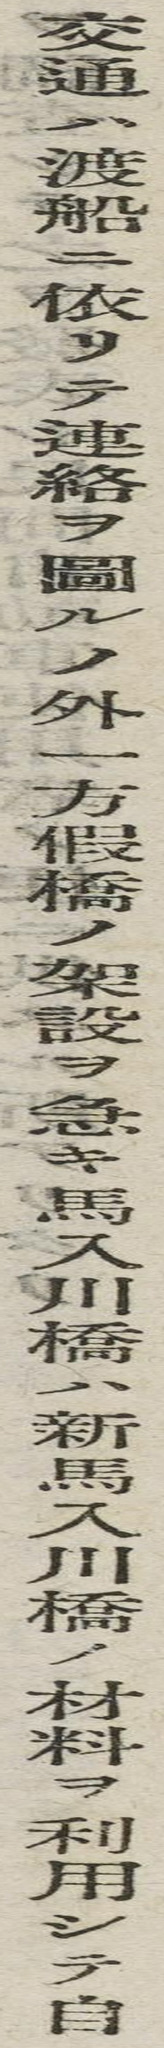交通ハ渡船ニ依リテ連絡ヲ図ルノ外一方仮橋ノ架設ヲ急キ馬入川橋ハ新馬入川橋ノ材料ヲ利用シテ自
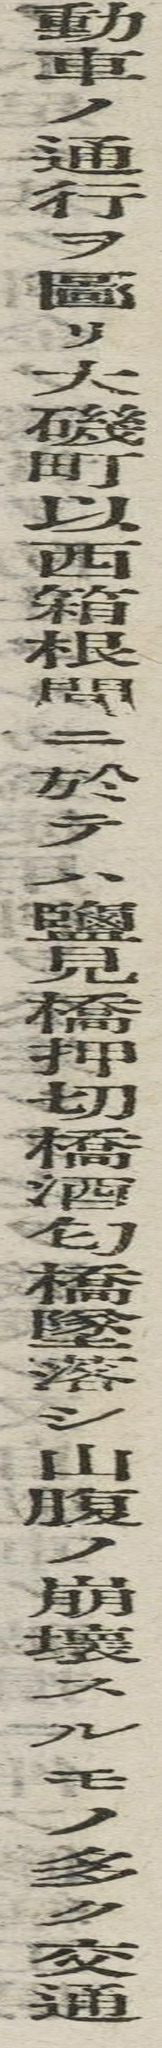動車ノ通行ヲ図リ大磯町以西箱根間ニ於テハ塩見橋押切橋酒匂橋墜落シ山腹ノ崩落スルモノ多ク交通
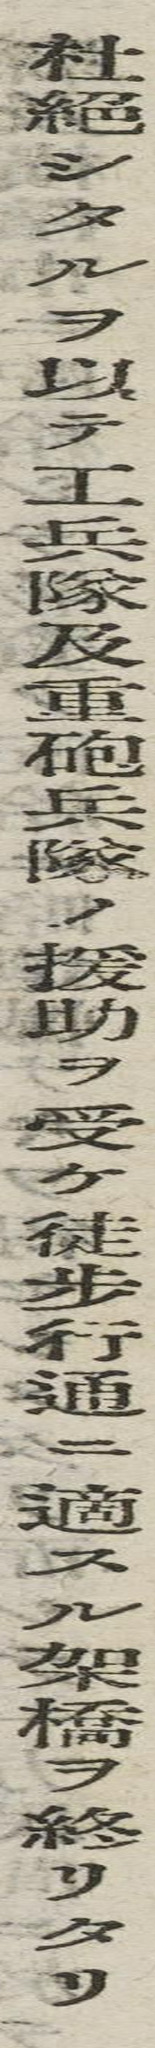杜絶シタルヲ以テ工兵隊及重砲兵隊ノ援助ヲ受ケ徒歩交通ニ適スル架橋ヲ終リタリ
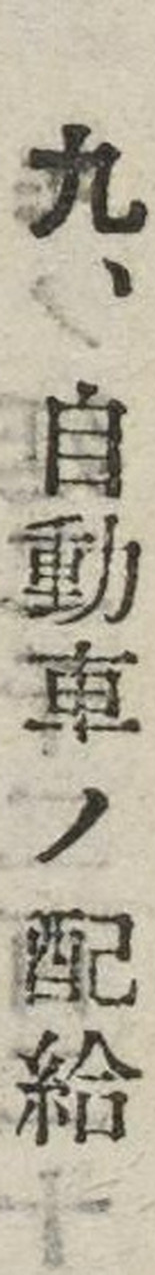九、自動車ノ配給
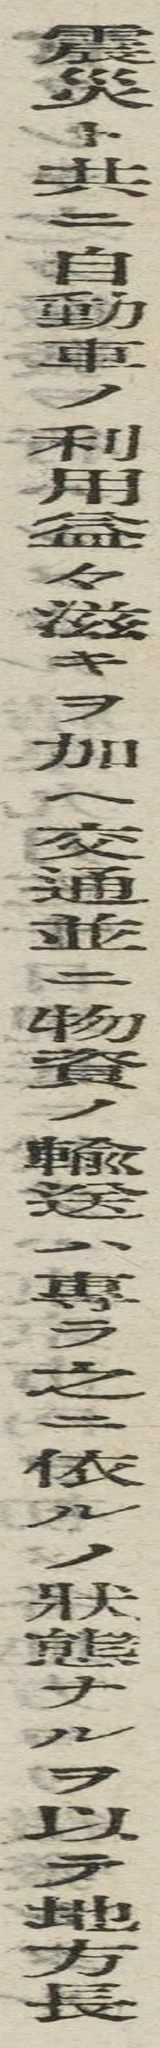震災ト共ニ自動車ノ利用益々滋キヲ加ヘ交通並ニ物資ノ輸送ハ専ラ之ニ依ルノ状態ナルヲ以テ地方長

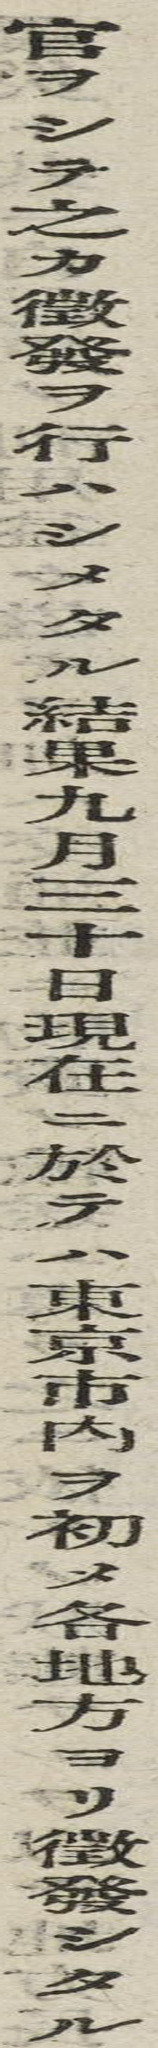官ヲシテ之カ徴発ヲ行ハシメタル結果九月三十日現在ニ於テハ東京市内ヲ初メ各地方ヨリ徴発シタル
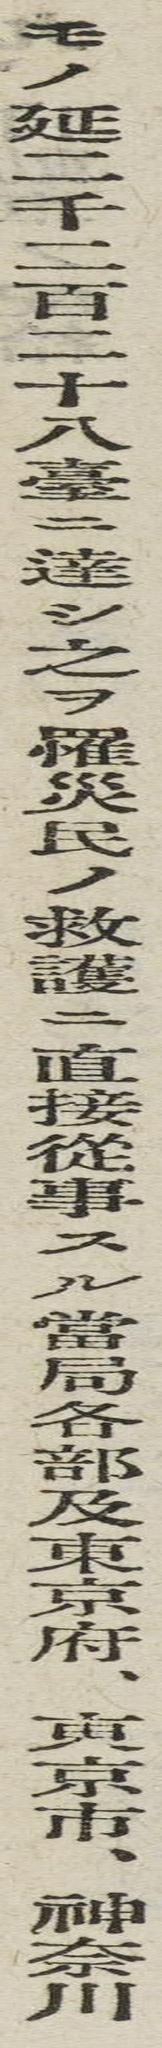モノ延二千二百二十八台ニ達シ之ヲ罹災民ノ救護ニ直接従事スル当局各部及東京府、東京市、神奈川
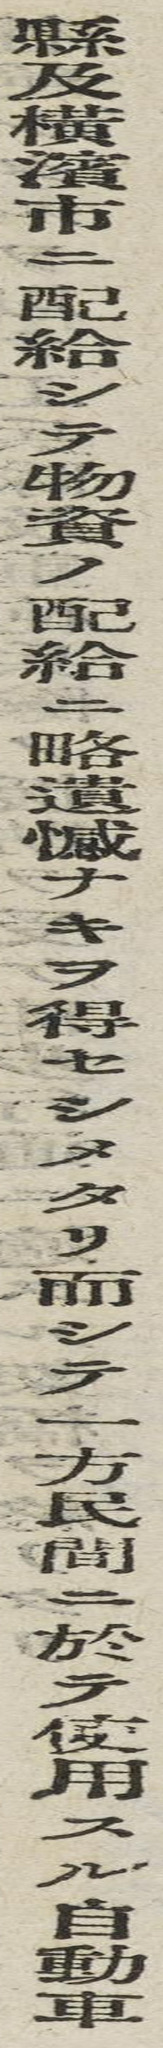県及横浜市ニ配給シテ物資ノ配給ニ略遺憾ナキヲ得セシメタリ而シテ一方民間ニ於テ使用スル自動車
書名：震災被害状況並救護施設概要
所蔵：東京大学地震研究所図書室 Earthquake Research Institute Library, The University of Tokyo, JAPAN
